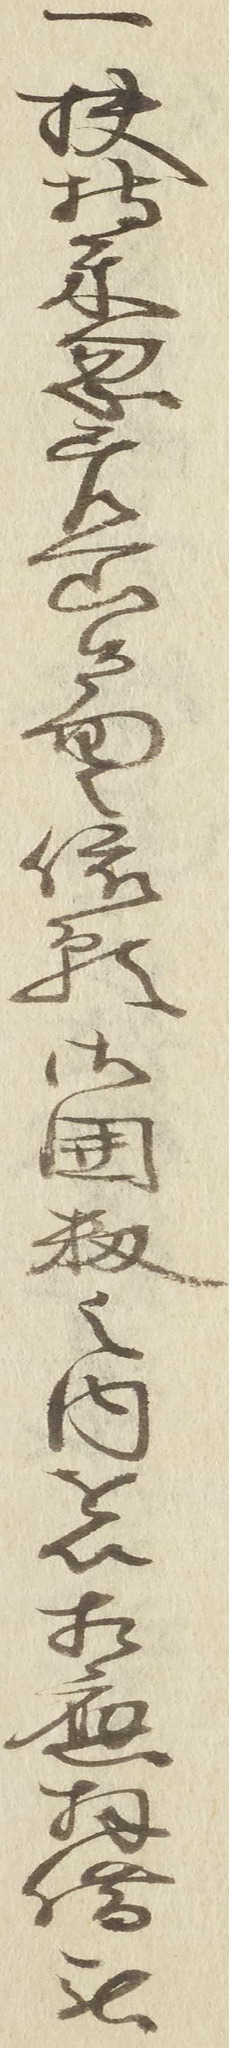一扶持米忽差閊候面々依願御囲籾之内を以相応拝借被

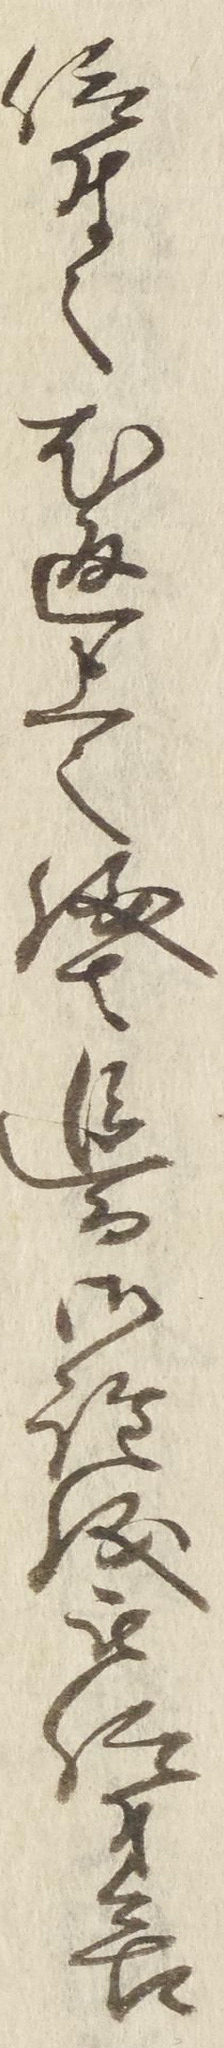仰付之尤返上之儀は追而御詮議被仰付筈
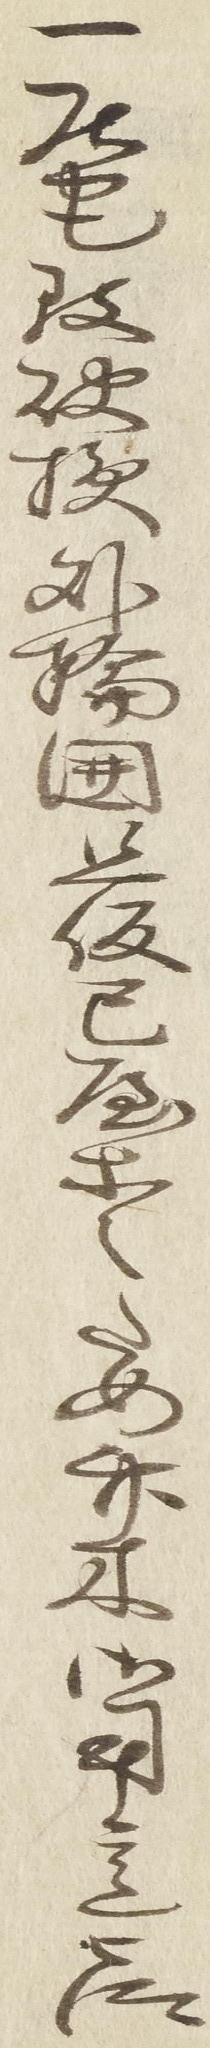一居宅致破損外輪囲且仮己屋等之ため竹木御用意被仰
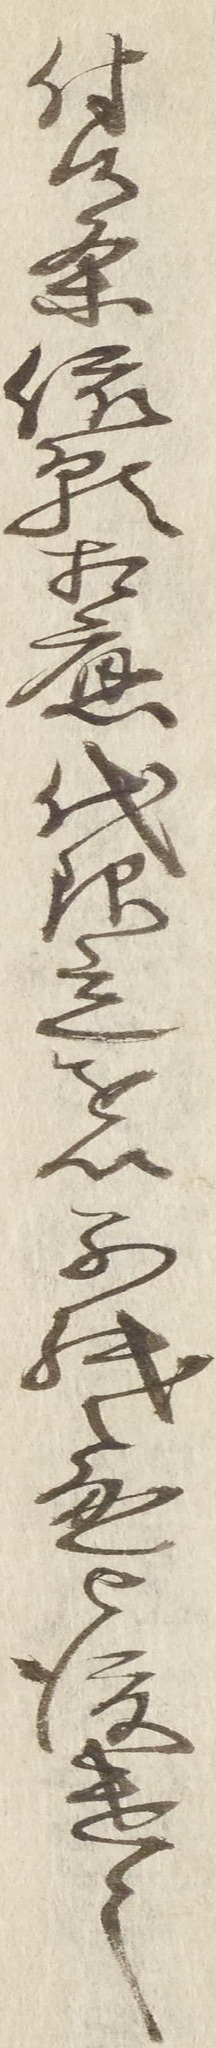付候条依願相応代銀立を以別紙之通被渡遣之
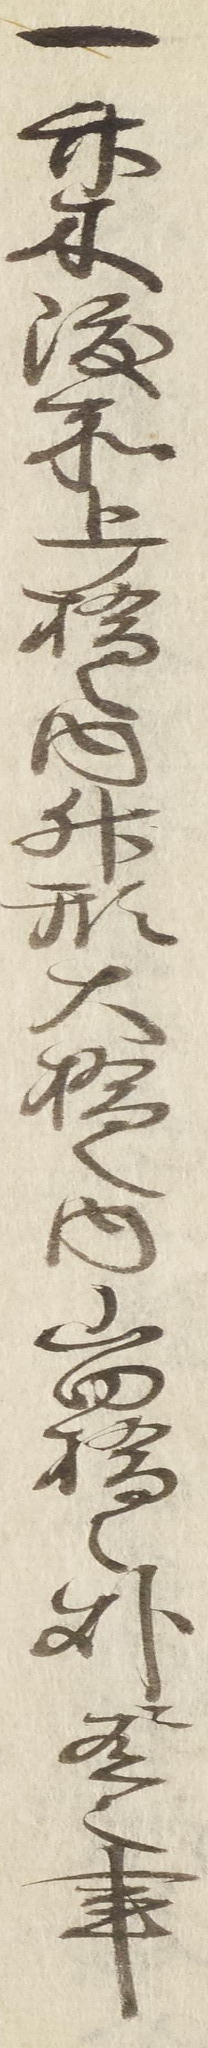一竹木渡所上の橋之内升形大橋之内山田橋之外に有之事
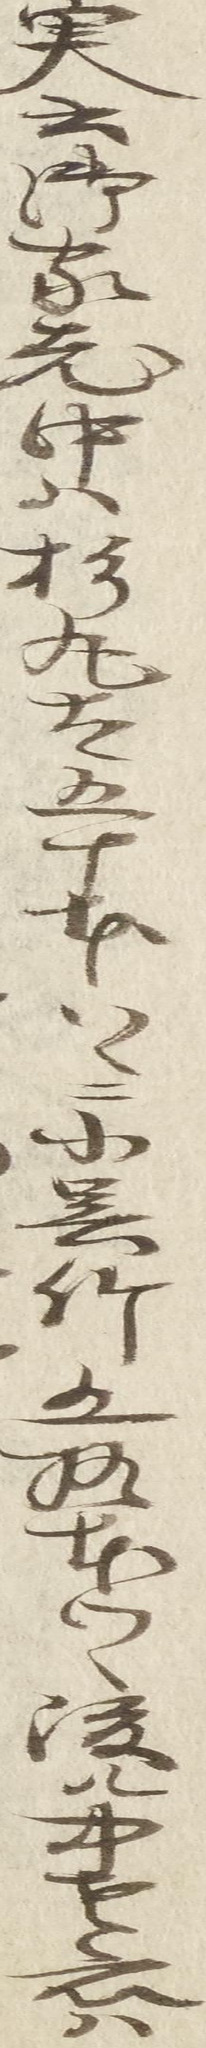実云御家老中は杉丸太五十本づゝに小呉竹五拾本つゝ渡る中老衆は
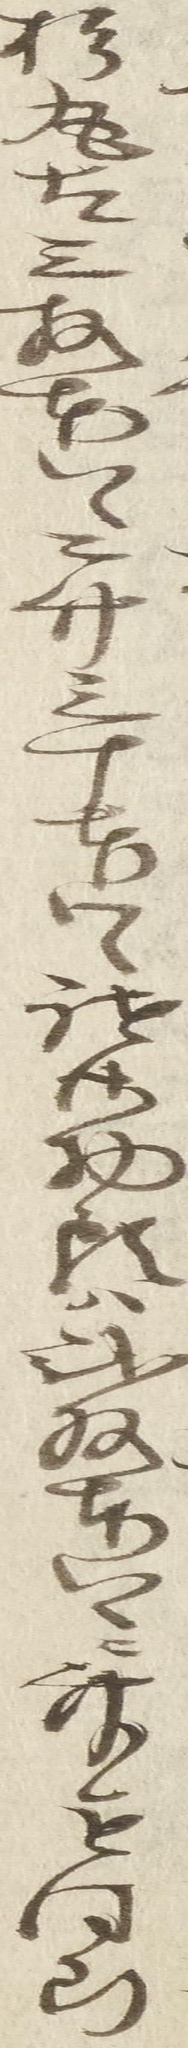杉丸太三拾本つゝに竹三十本つゝ諸御物頭は弐拾本つゝに竹も同断
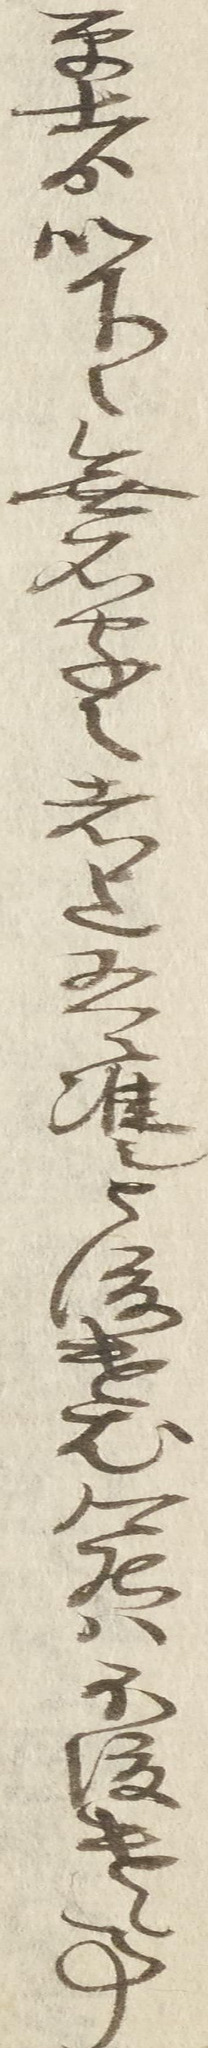平士より以下の無名字の者迄右に准し被渡遣候尤郷居は不渡遣候事
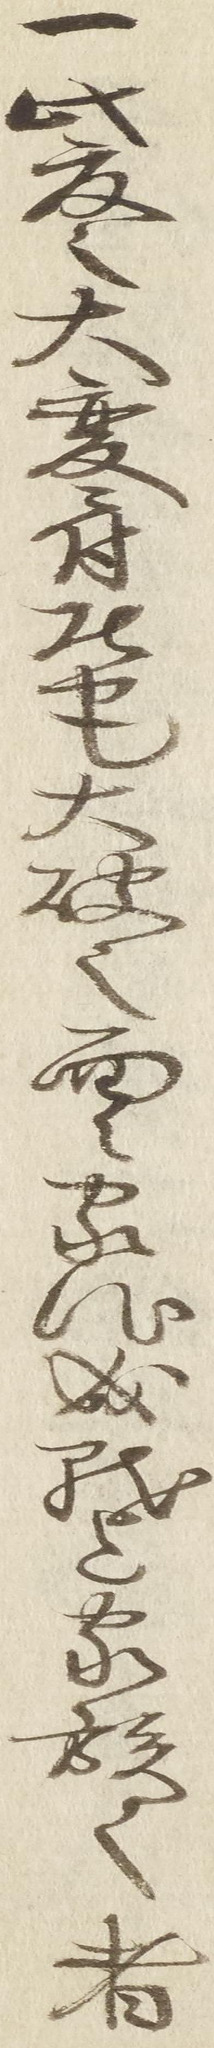一此度之大変に付居宅大破之面々家作成就迄家族之者
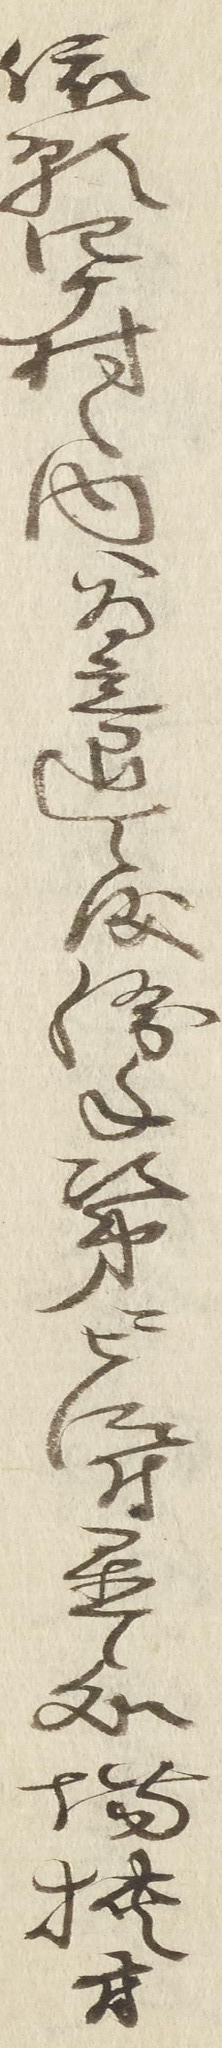依願四ケ村之内へ為立退之儀勝手次第に被仰付置候処場狭に付
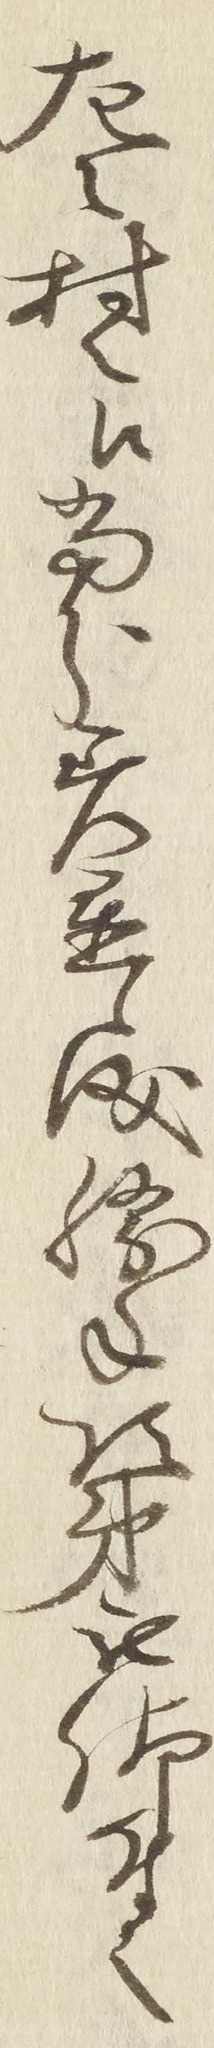左之村々え当分差置候儀勝手次第被仰付之
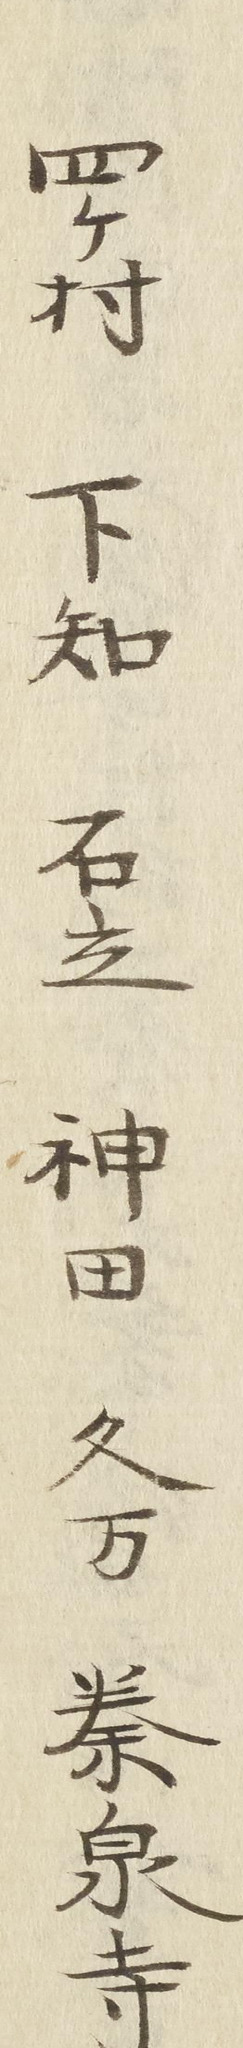四ヶ村下知石立神田久万秦泉寺
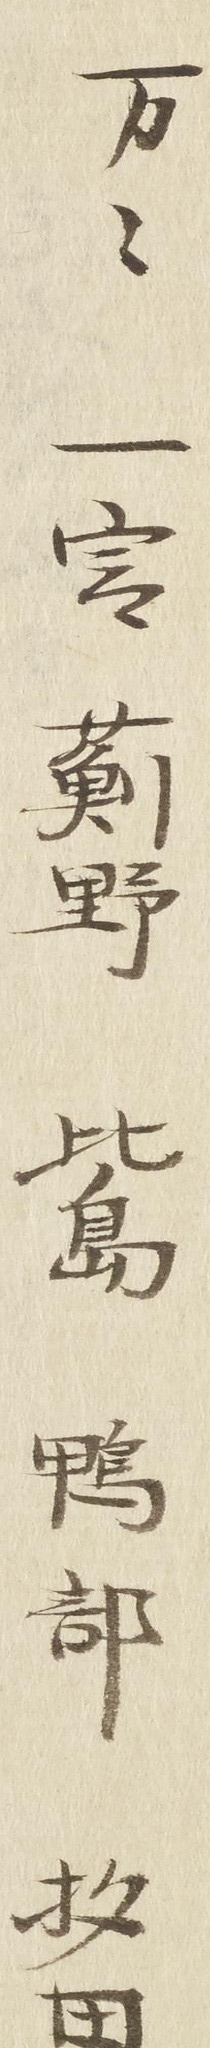万々一宮薊野比島鴨部杓田
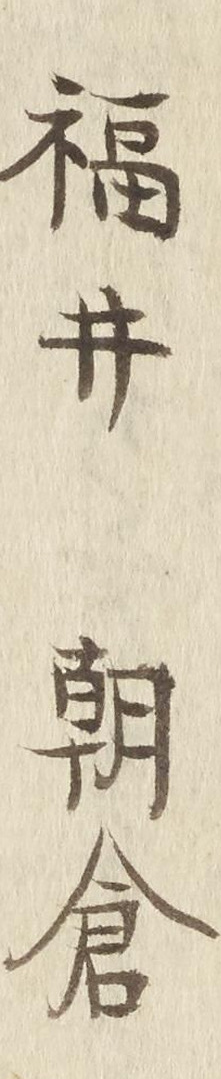福井朝倉
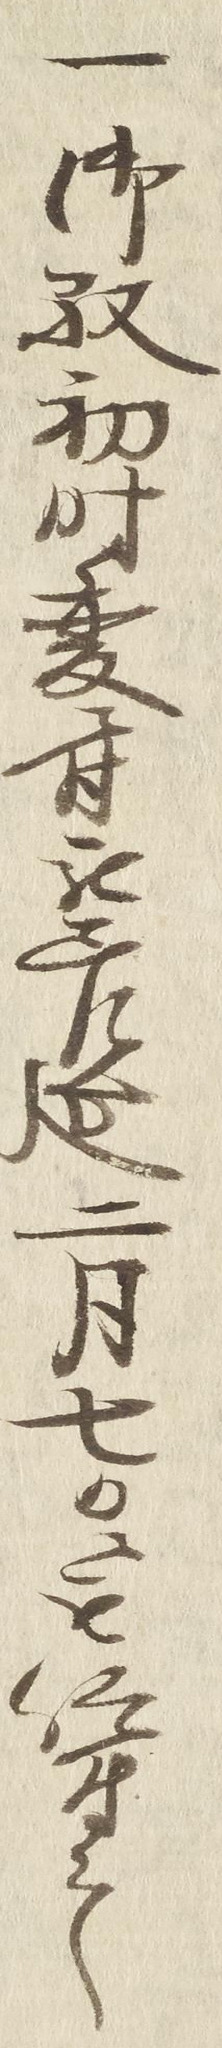一御紋初時変に付被差延二月七日に被仰付之
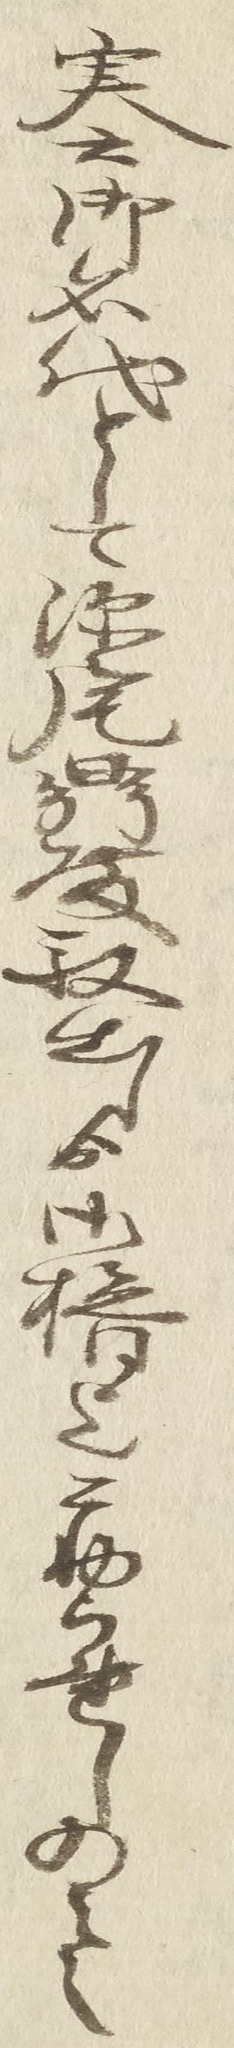実云御名代として源片弼殿紋出より御橋迄勤られしのみ也
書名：地震記　上
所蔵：東京大学地震研究所図書室 Earthquake Research Institute Library, The University of Tokyo, JAPAN
